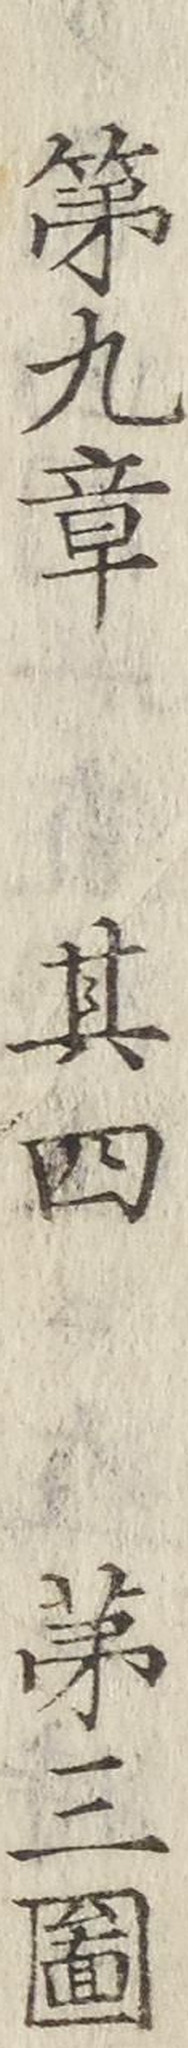第九章其四第三図
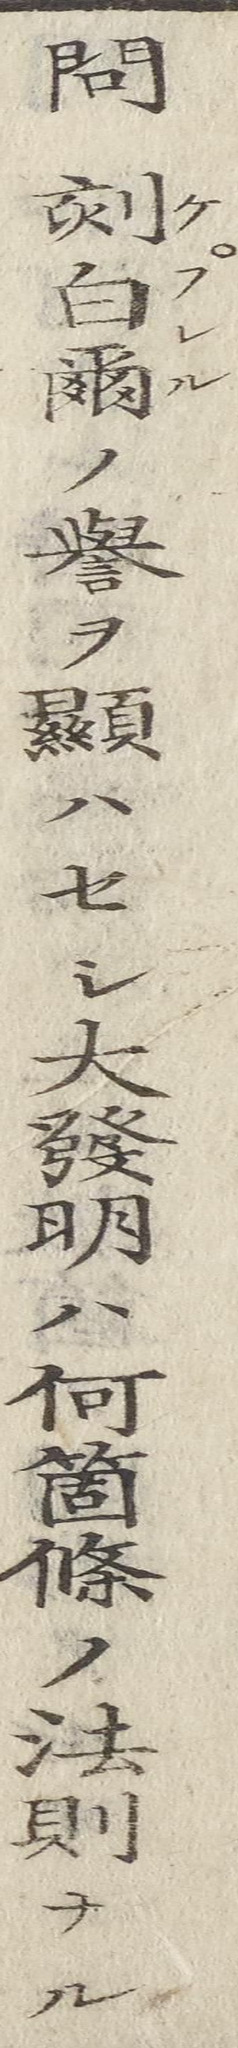問刻白爾ノ誉ヲ顕ハセシ大発明ハ何箇条ノ法則ナル
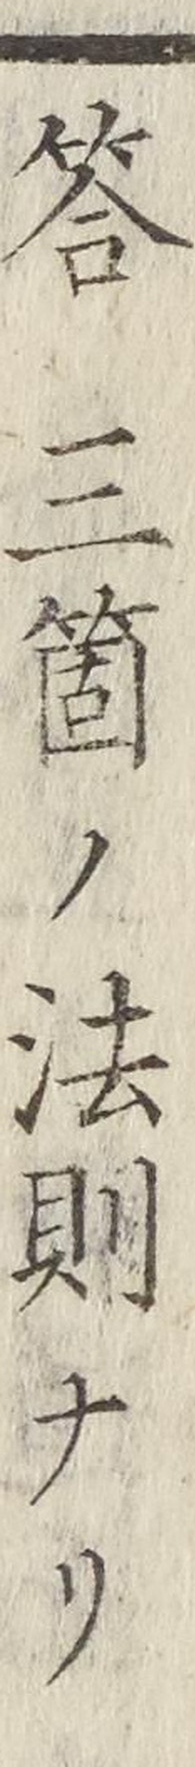答三箇ノ法則ナリ
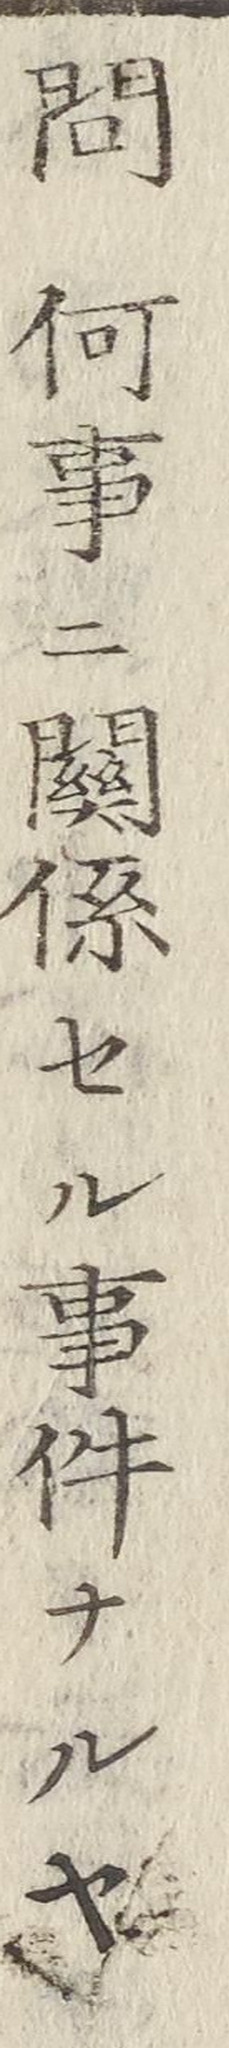問何事ニ関係セル事件ナルヤ
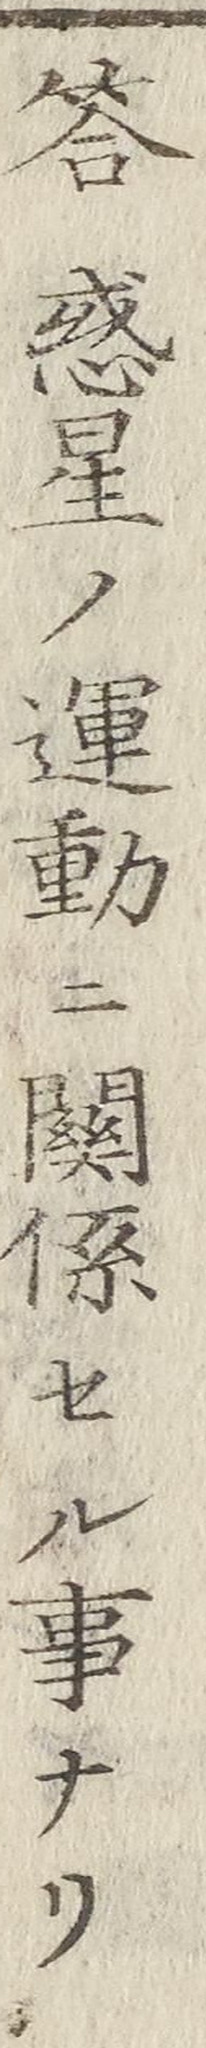答惑星ノ運動ニ関係セル事ナリ
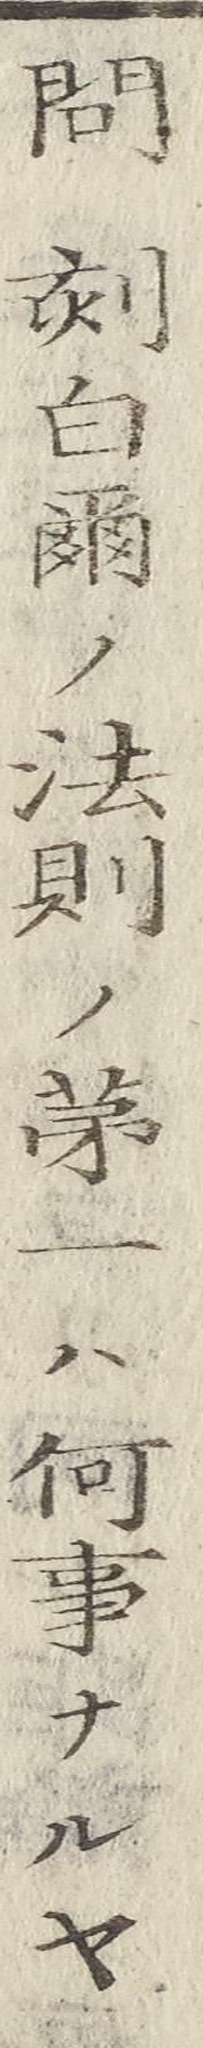問刻白爾ノ法則ノ第一ハ何事ナルヤ
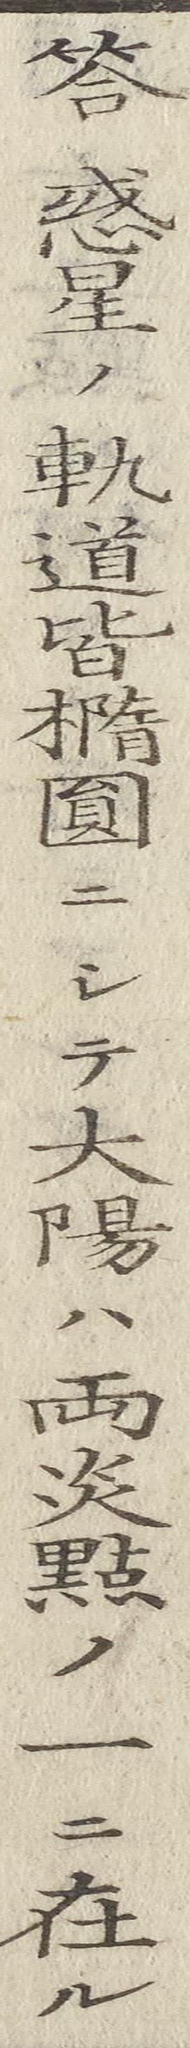答惑星ノ軌道皆楕円ニシテ大陽ハ両炎点ノ一ニ在ル
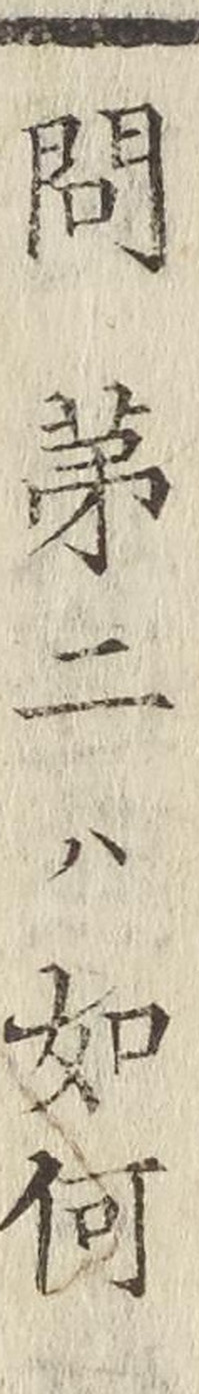問第二ハ如何
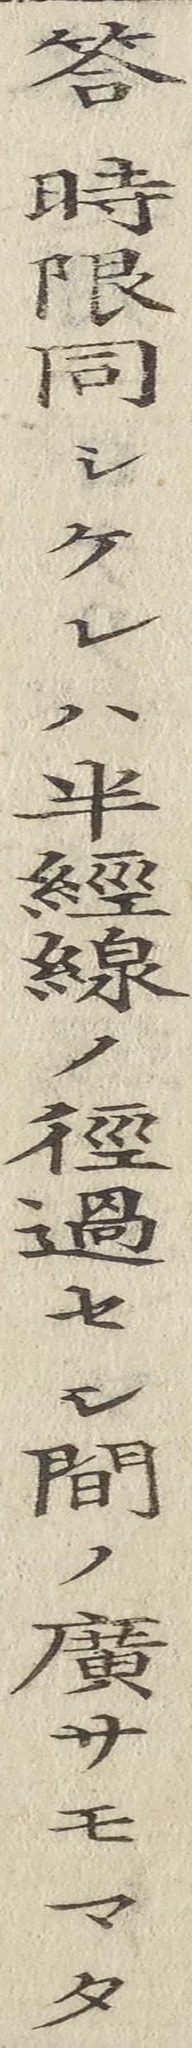答時限同シケレハ半径線ノ経過セシ間ノ広サモマタ
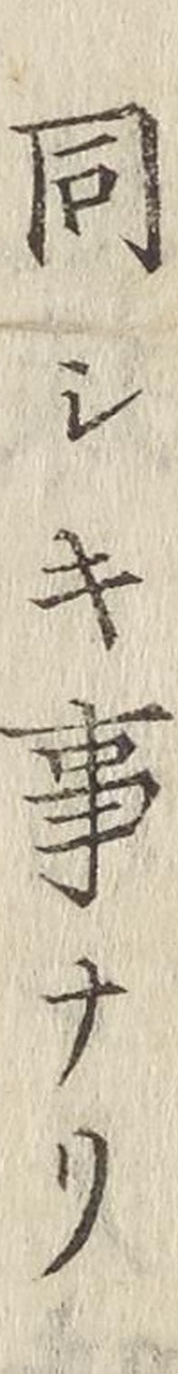同シキ事ナリ
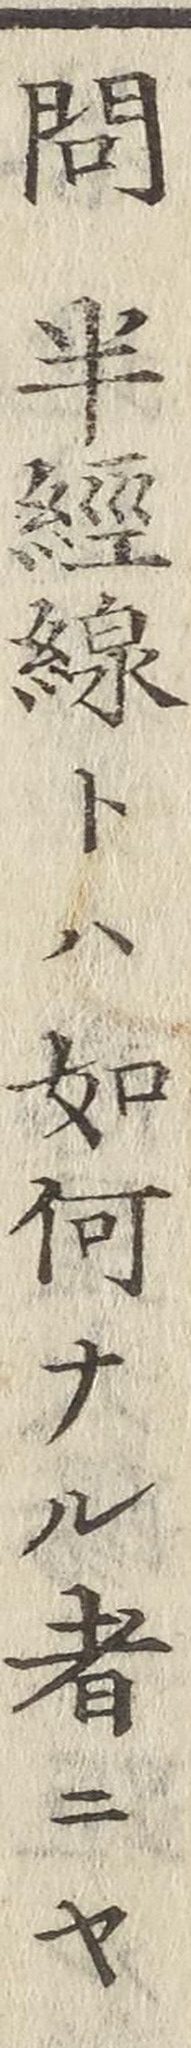問半径線トハ如何ナル者ニヤ
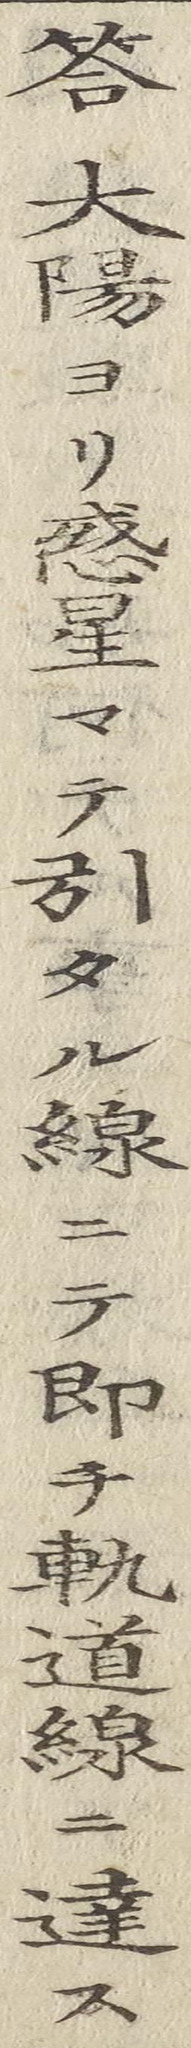答大陽ヨリ惑星マテ引タル線ニテ即チ軌道線ニ達ス
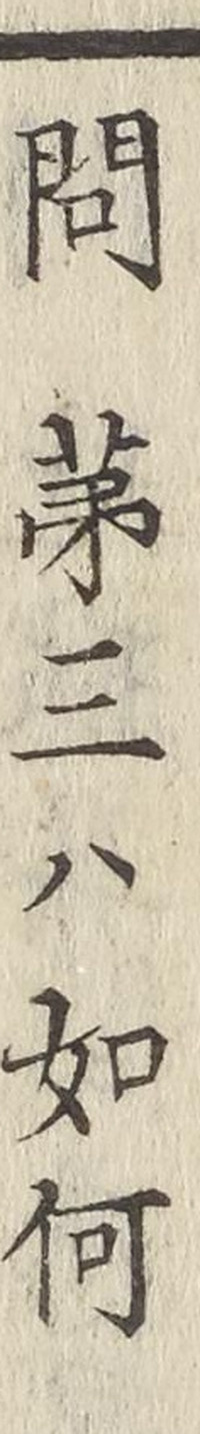問第三ハ如何
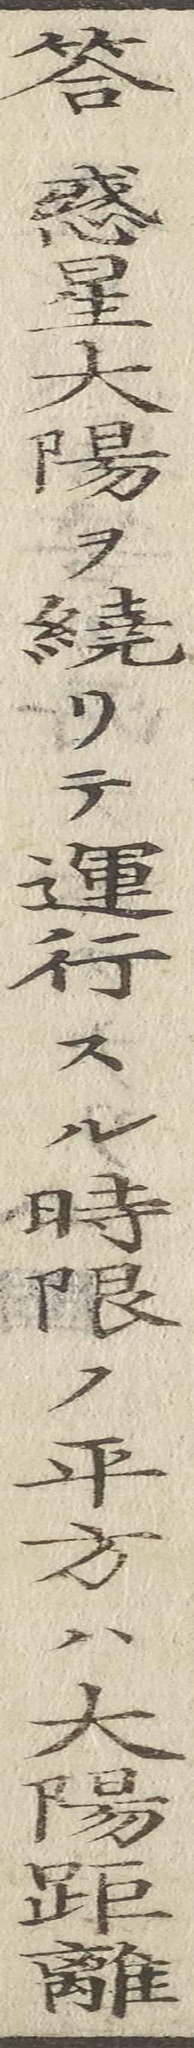答惑星大陽ヲ繞リテ運行スル時限ノ平方ハ大陽距離
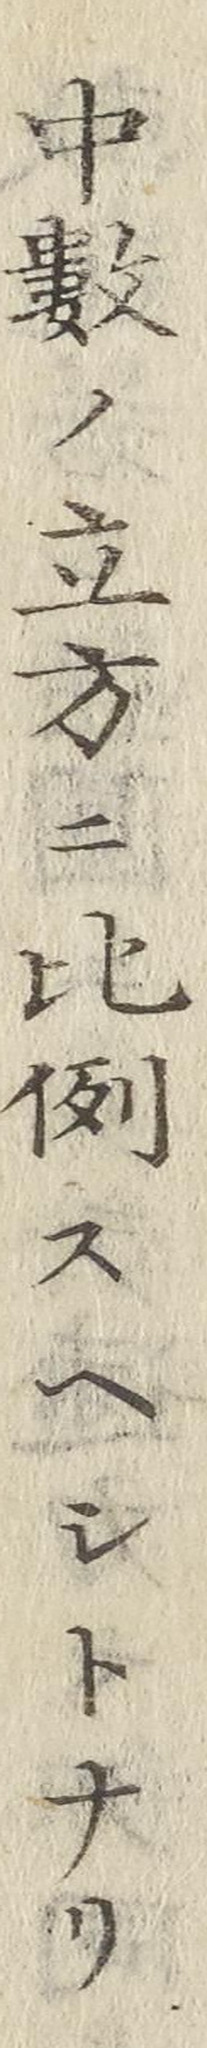中数ノ立法ニ比例スヘシトナリ
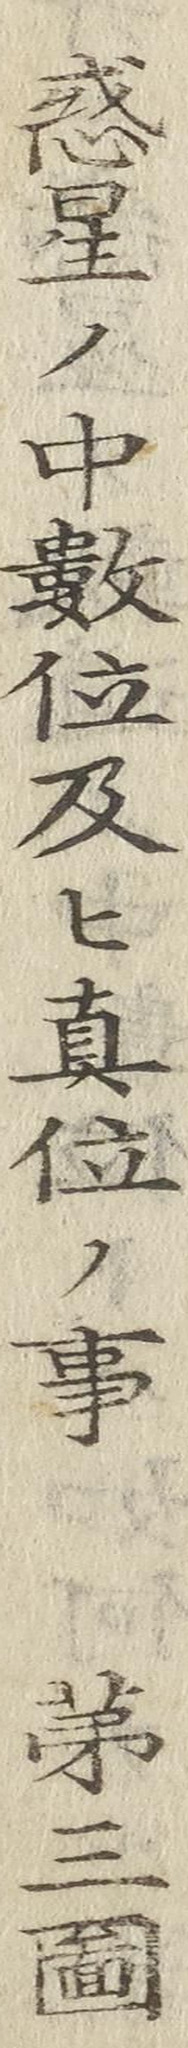惑星ノ中数位及ヒ真位ノ事第三図
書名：星学圖説　上
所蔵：東京大学地震研究所図書室 Earthquake Research Institute Library, The University of Tokyo, JAPAN
